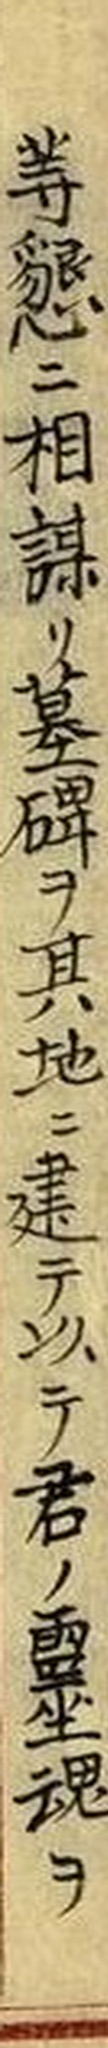等懇ニ相謀リ墓碑ヲ其地ニ建テ以テ君ノ霊魂ヲ
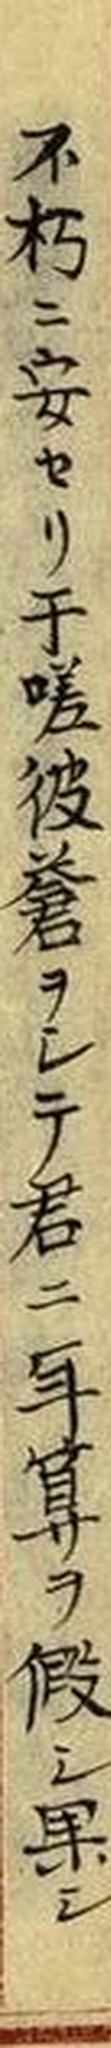不朽ニ安セリ于嗟彼誉ヲシテ君ニ年算ヲ仮シ果シ
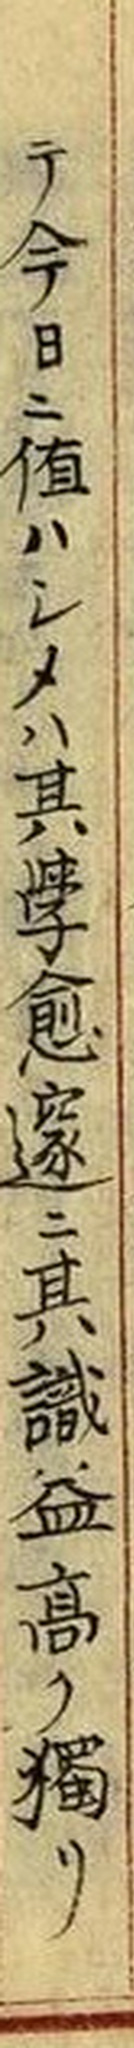テ今日ニ値ハシメハ其学愈邃ニ其識益高ク独リ
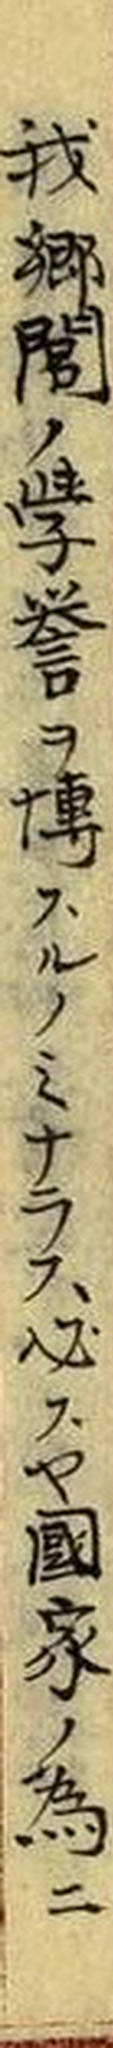我郷閭ノ学誉ヲ博スルノミナラス必スヤ国家ノ為ニ
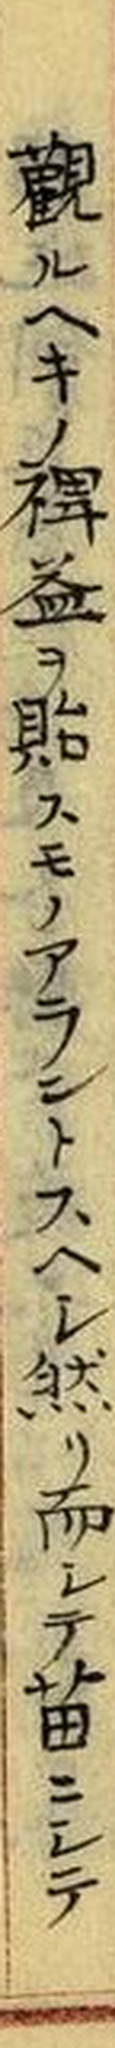観ㇽヘキノ裨益ヲ貽スモノアラントスへシ然リ而シテ苗ニシテ
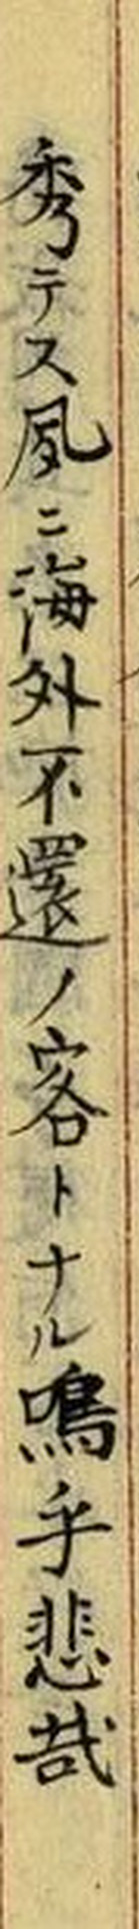秀テス夙ニ海外不還ノ客トナル嗚乎悲哉
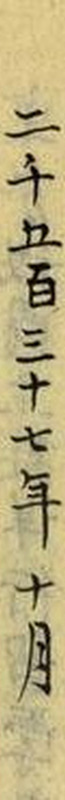二千五百三十七年十月
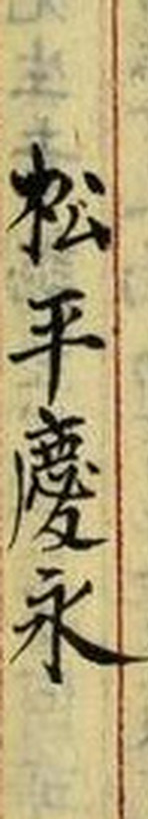松平慶永

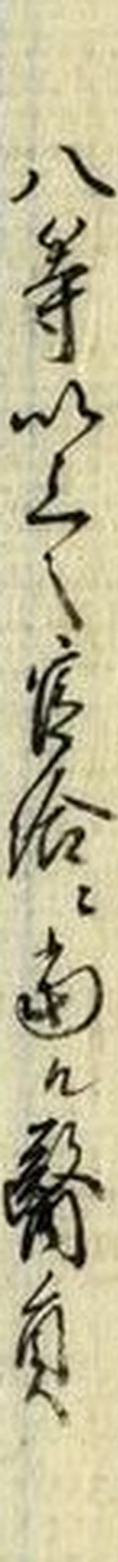八等以上之官給ニ当ㇽ医員
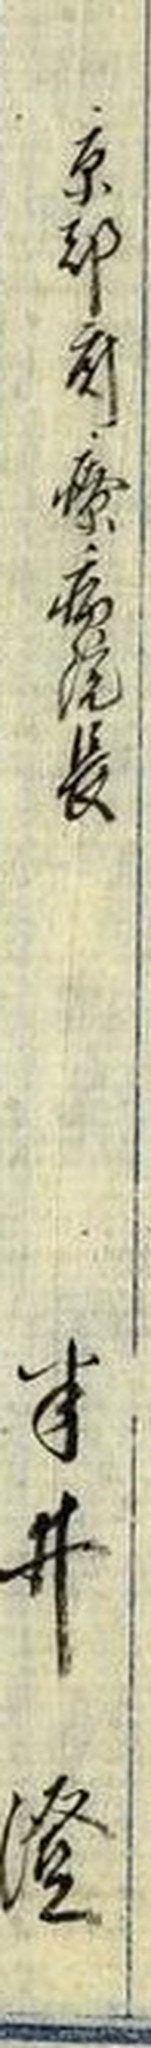京都府療病院長半井澄
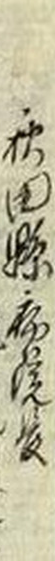秋田県病院長
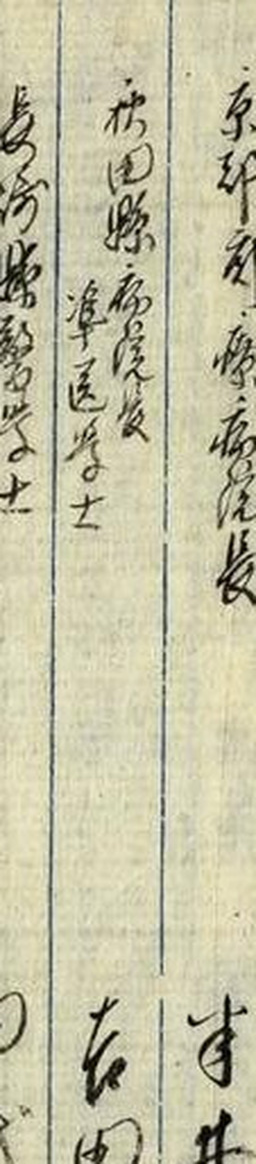秋田県病院長
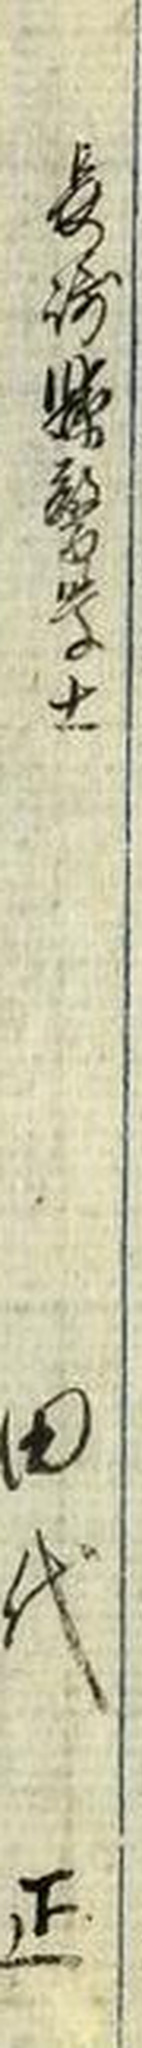長崎県医学士田代正
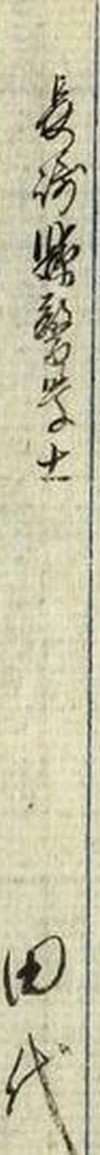長崎県医学士田代正
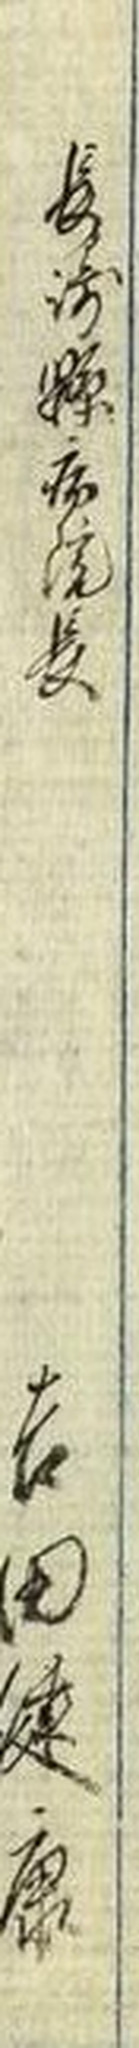長崎県病院長吉田健康
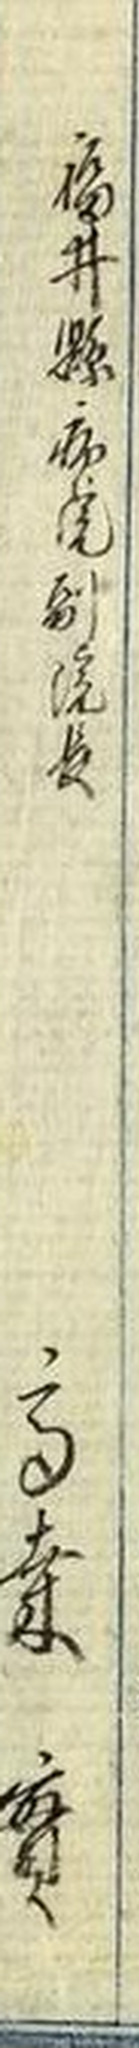福井県病院副院長高桑実
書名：温古集 三巻
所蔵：福井県文書館 Fukui Prefectural Archives
